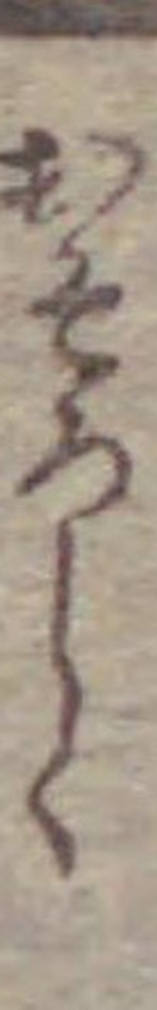おそろしく
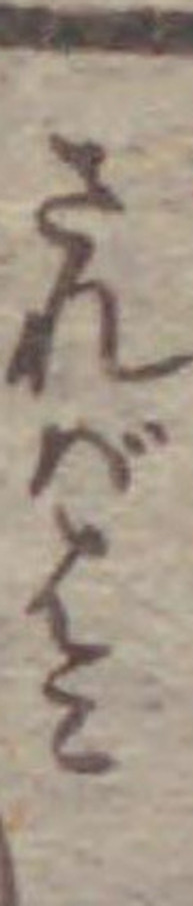さればはこ
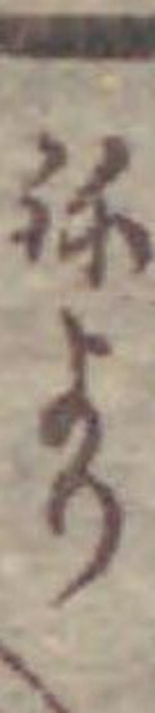ねより
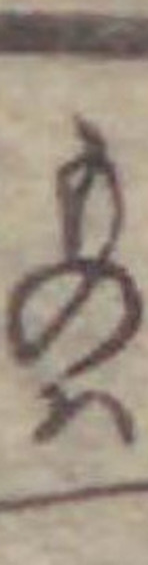ものは
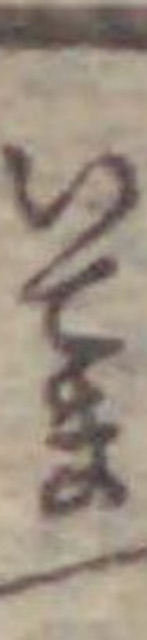いてま
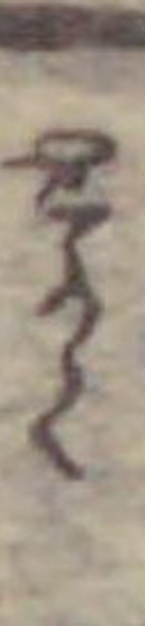とかく
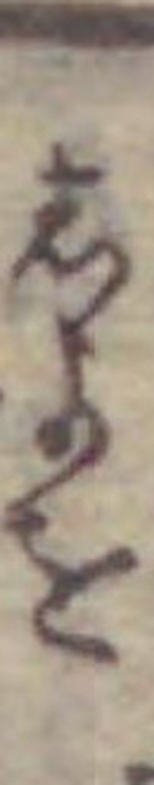しよを
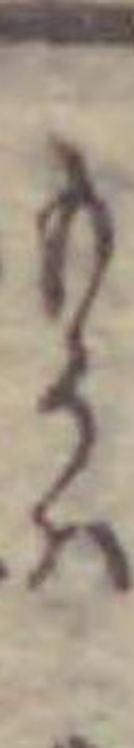もうは
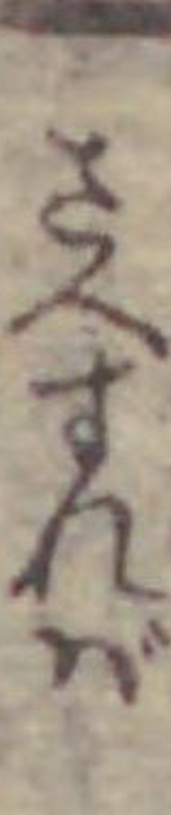さへすれば
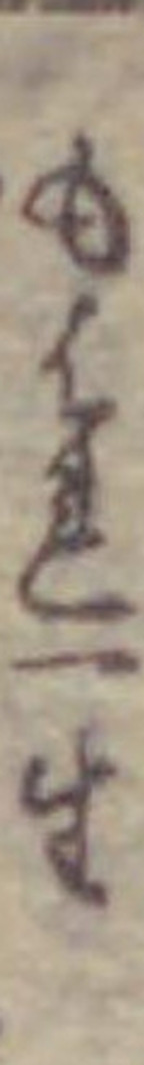もはれ一生
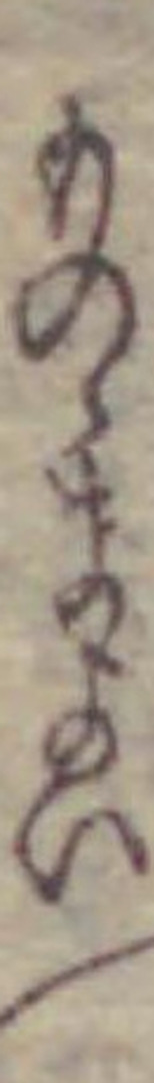ものゝまよい
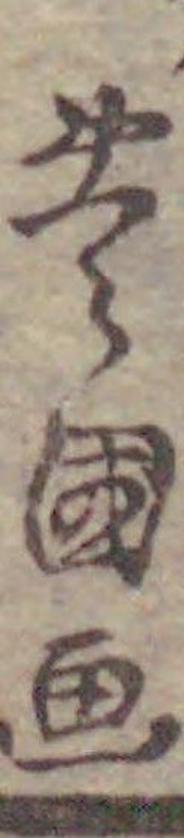豊国画
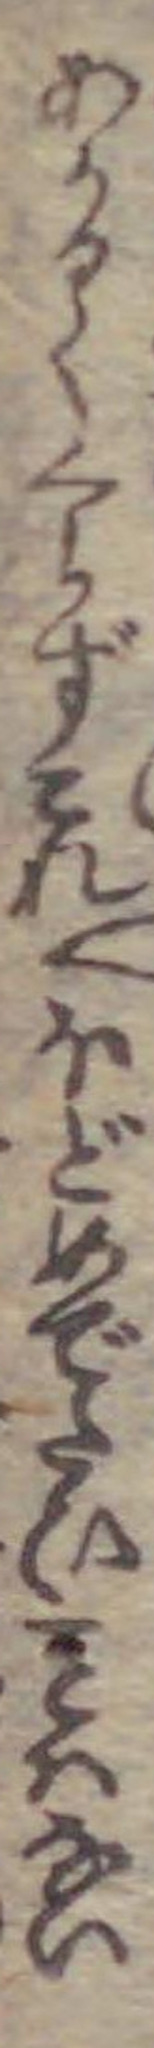あかるくくらずこれほどめでたひことはない
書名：武家物奇談 : 3巻
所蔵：国立国会図書館 National Diet Library, JAPAN
